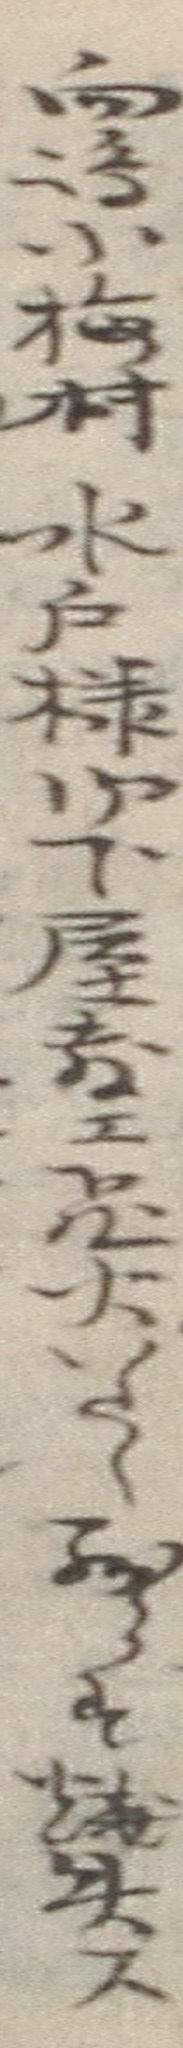向嶋小梅村水戸様御下屋敷え飛火いたし残らす焼失す
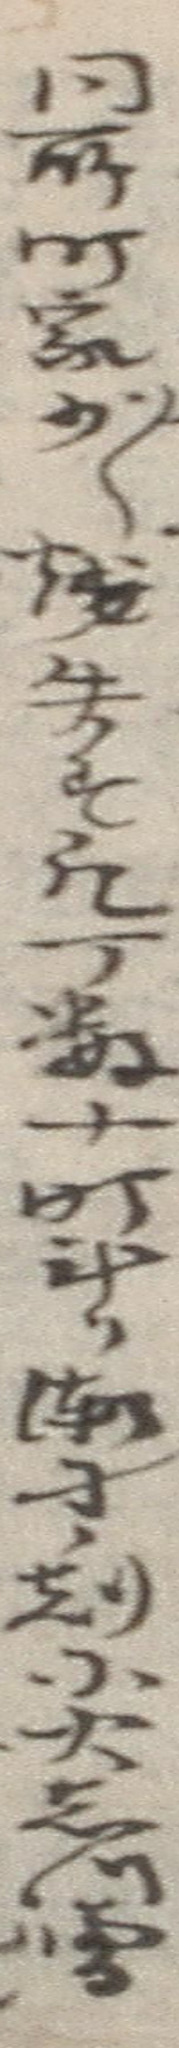同所町家少〱焼失す凡丁数十丁計り漸寅ノ刻に火しつまる
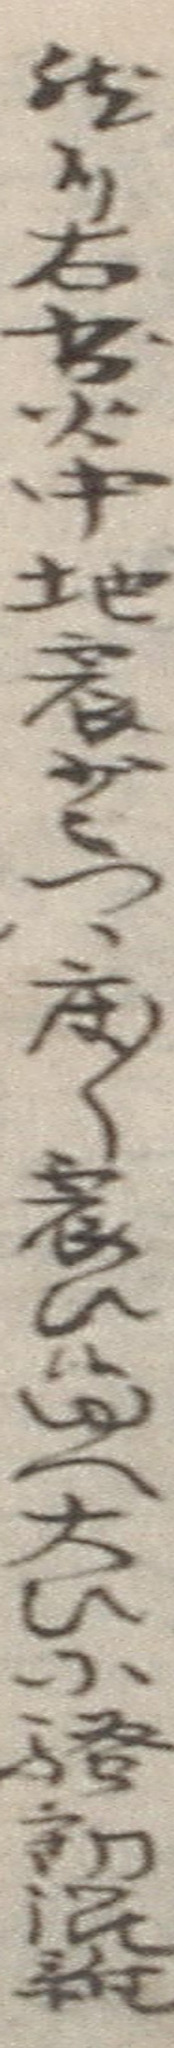然に右於火中地震少々つゝ度々震ひ候ゆへ大ひに騒動混雑
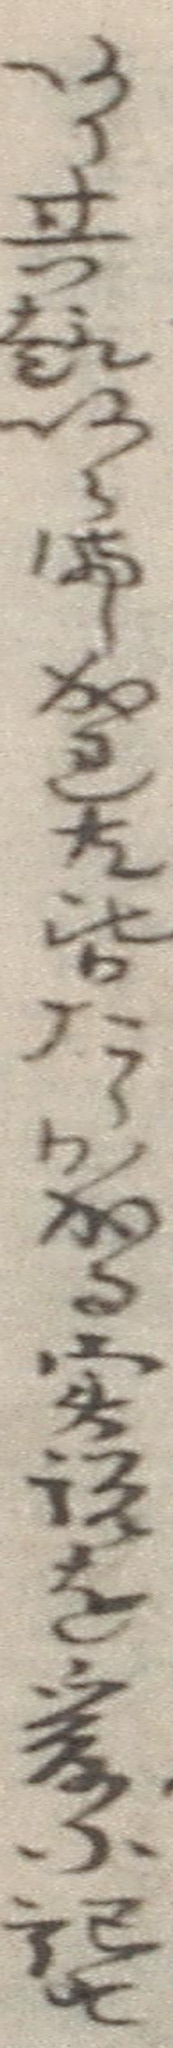あり其趣あらまし成れ共皆たしか成る実説を爰に記す
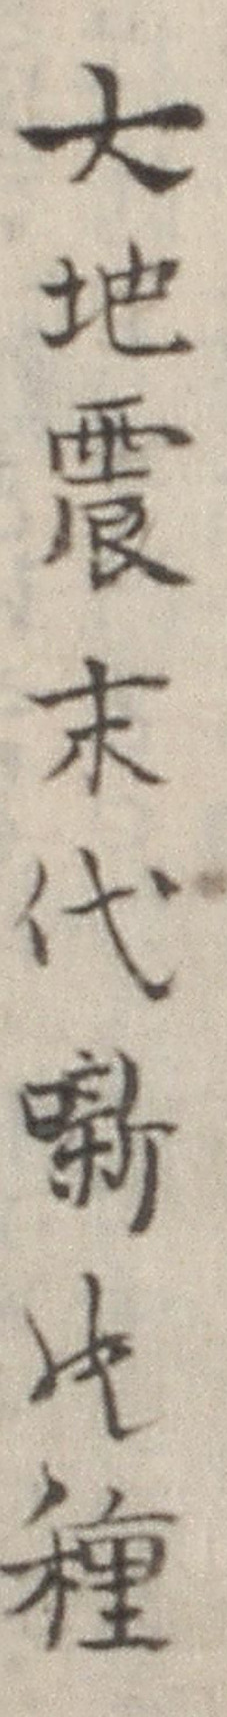大地震末代噺の種
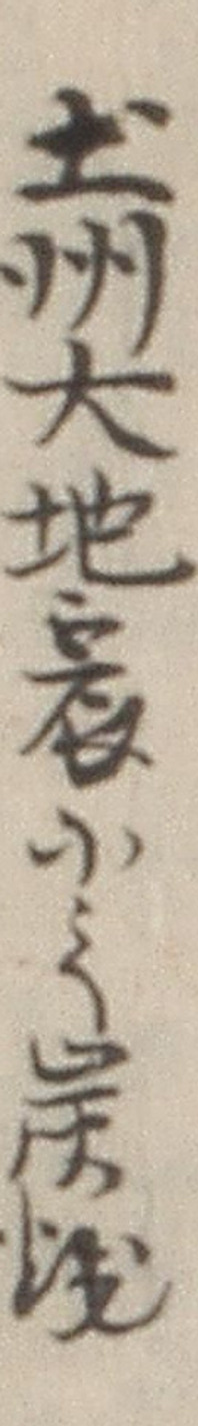土州大地震にて炭焼
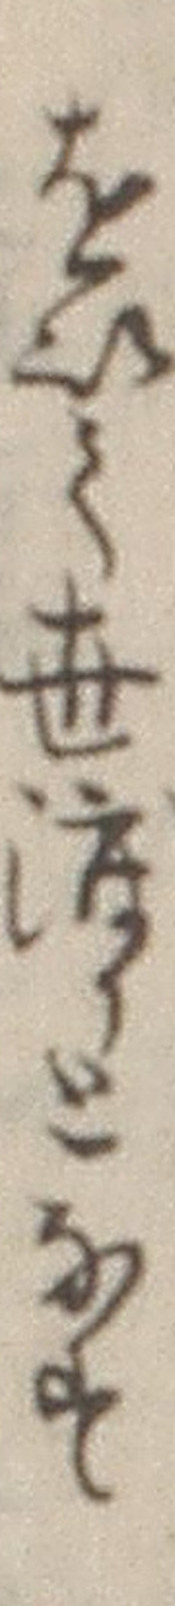を以て世渡りとなす
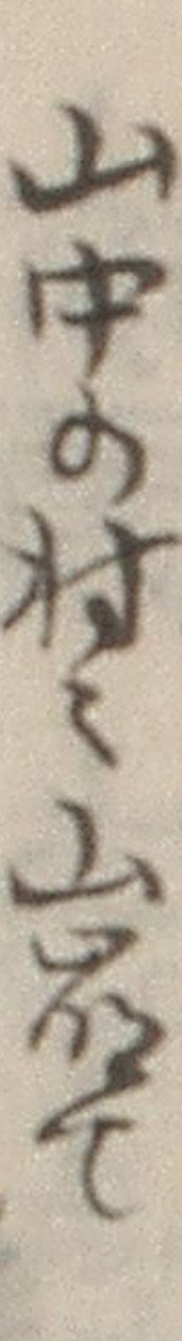山中の村々山崩て
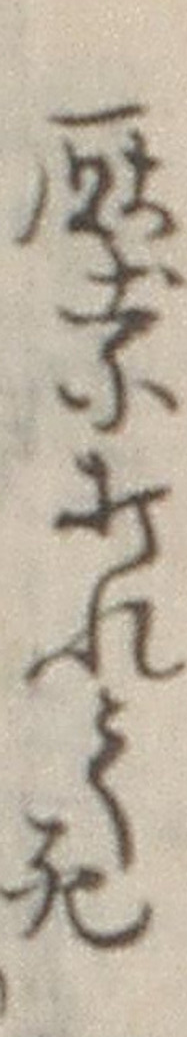壓に打れて死し
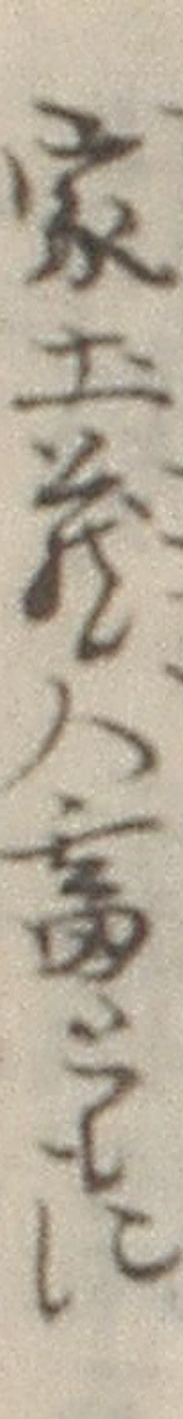家土蔵人畜ともに
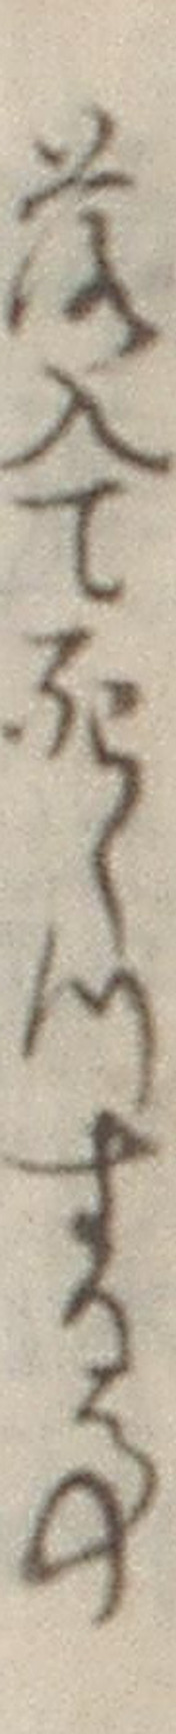落入て死しつする事
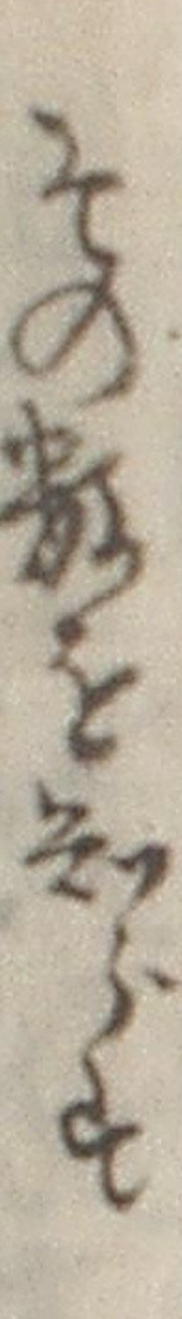その数を知らす
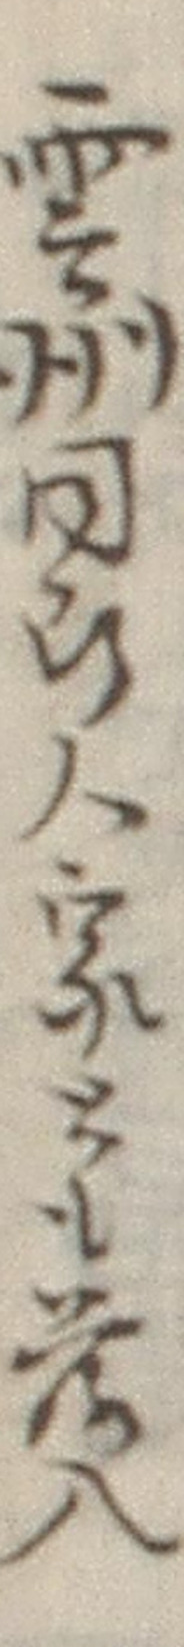雲州同断人家とも落入
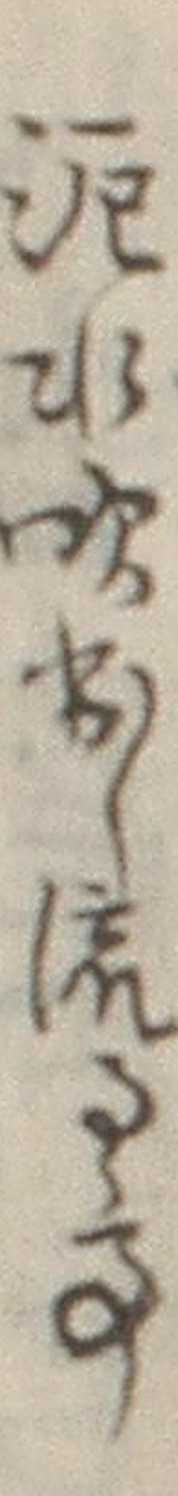泥水吹出し流る事
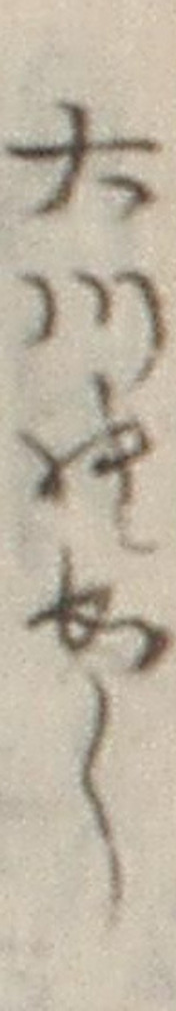大川の如し

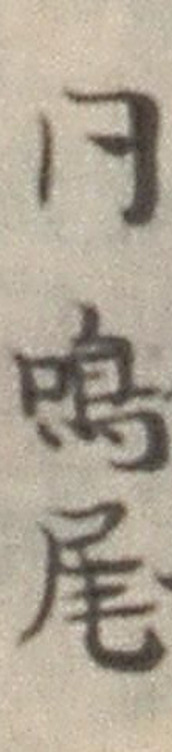同鳴尾
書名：諸國大地震年代記末代噺種
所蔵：東京大学地震研究所図書室 Earthquake Research Institute Library, The University of Tokyo, JAPAN
